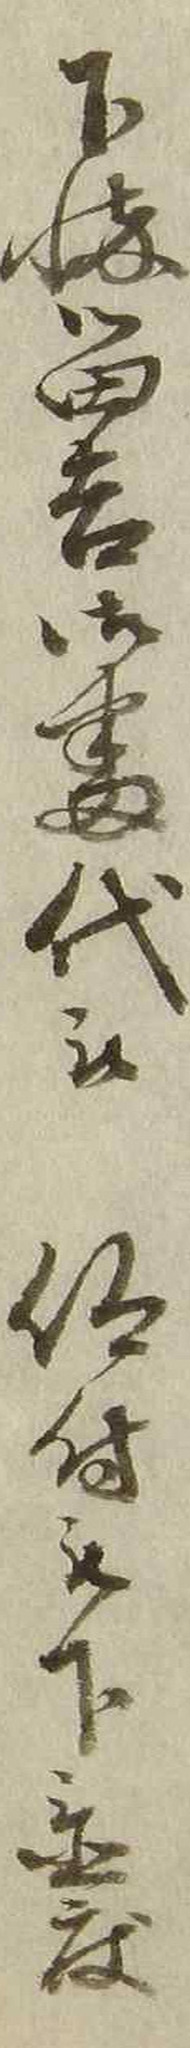下悴留吉御番代被仰付被下置度
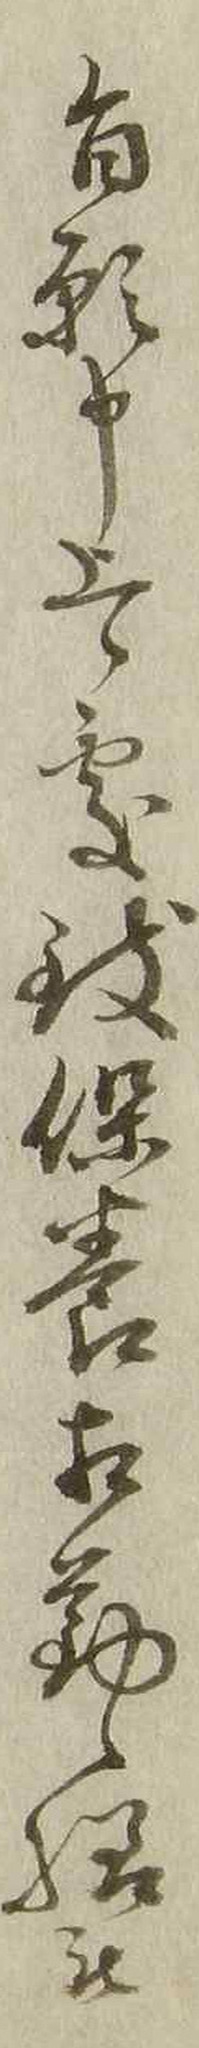旨願申上候処致保養相勤候様被
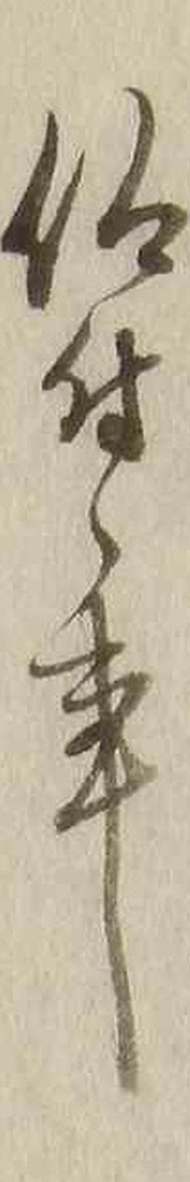仰付候事
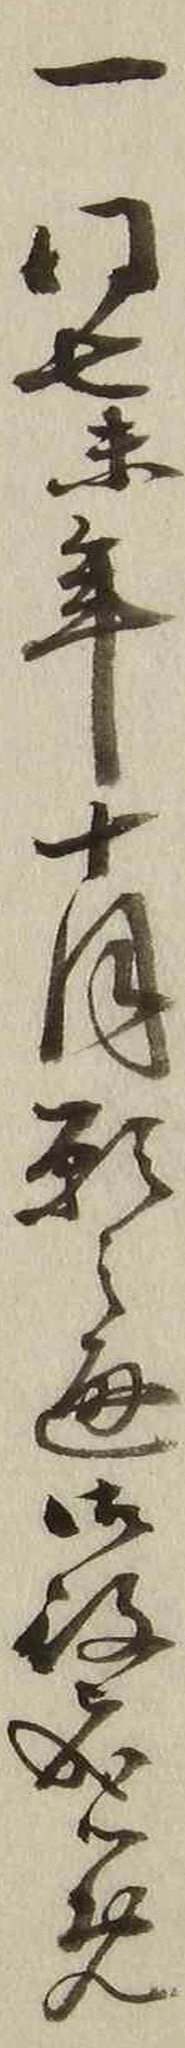一同七未年十月願之通御役被成御免
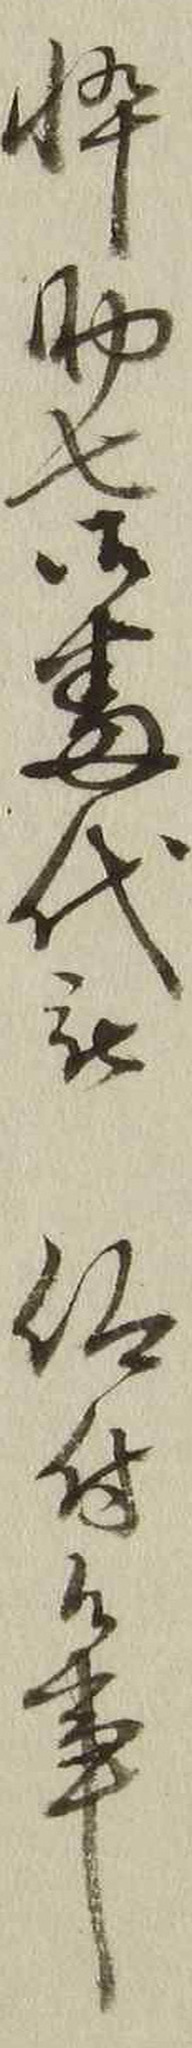忰助七御番代被仰付候事
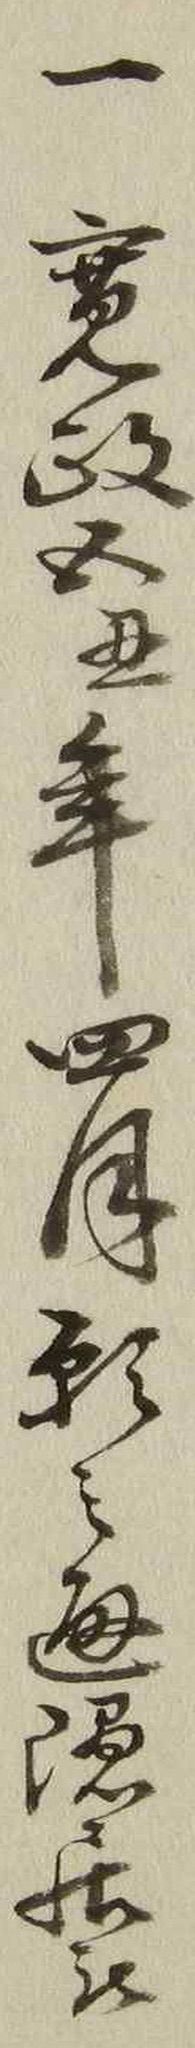一寛政五丑年四月願之通隠居被
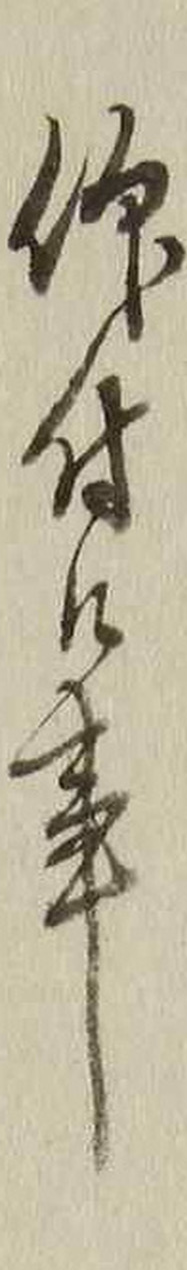仰付候事
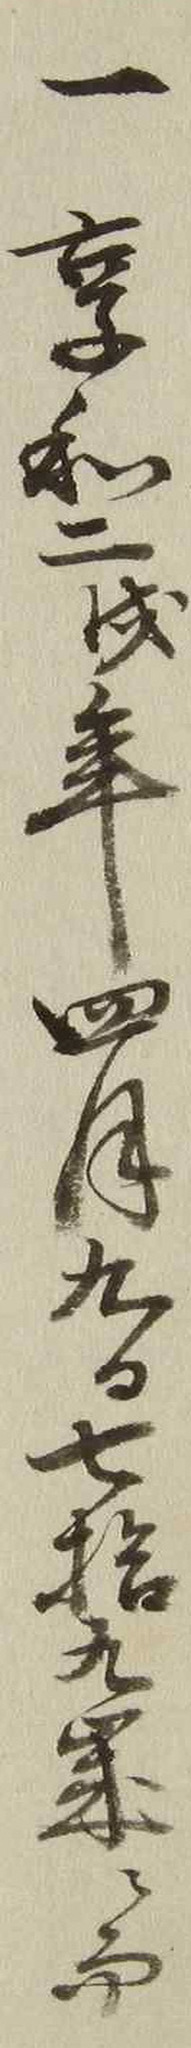一享和二戌年四月九日七拾九歳ニ而
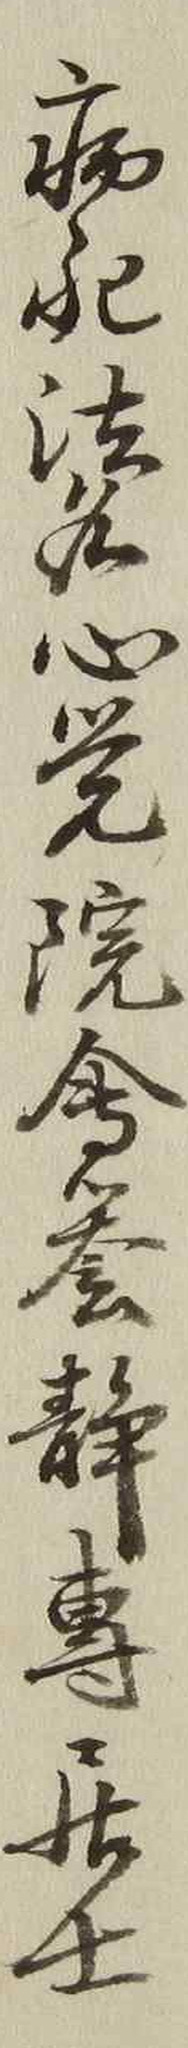病死法名心覚院会誉静専居士
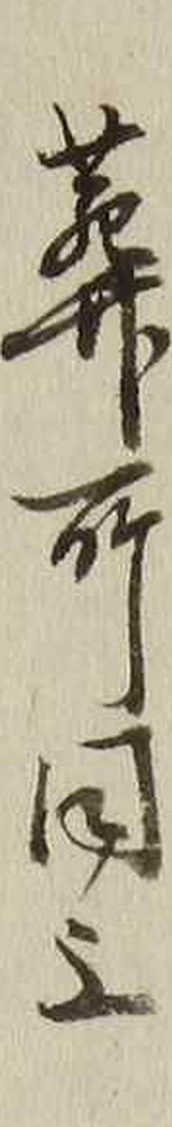葬所同上
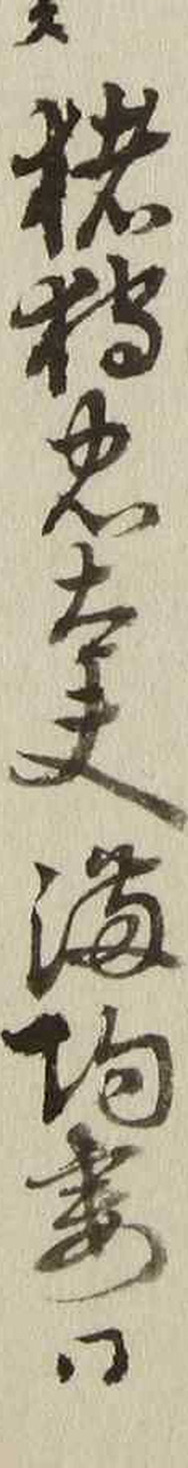猪狩忠太夫満均妻同
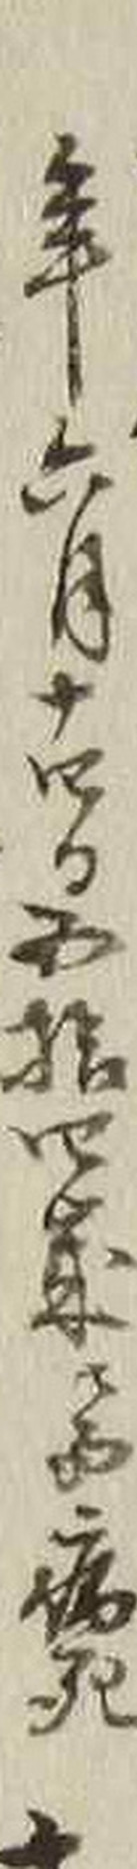年六月十四日五拾四歳ニ而病死
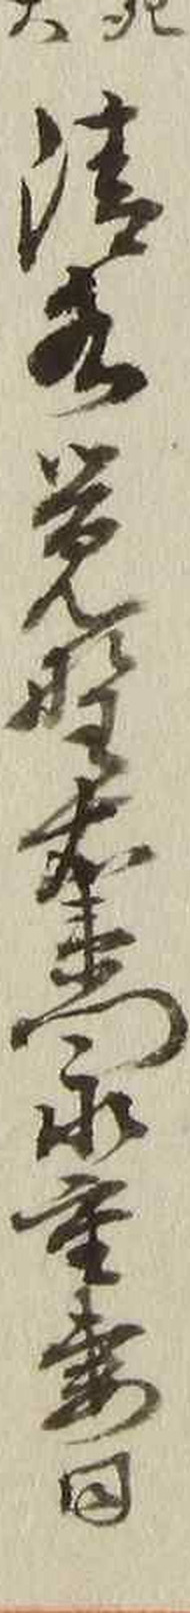清水覚野右衛門永重妻同
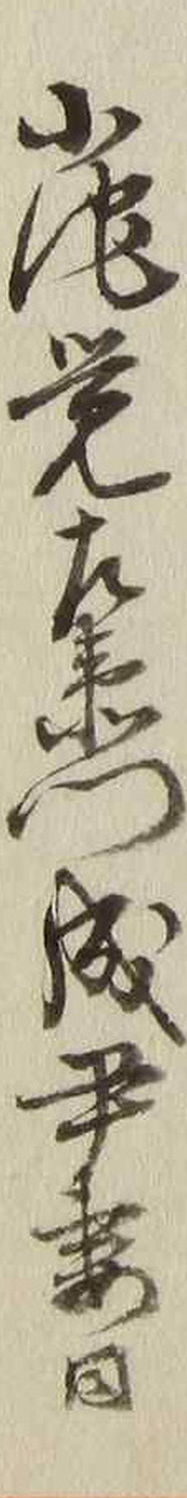小池覚左衛門成尹妻同
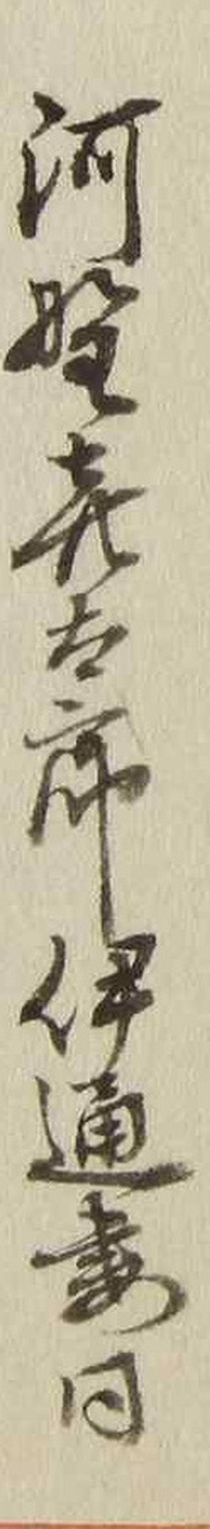河野喜太郎伊通妻同
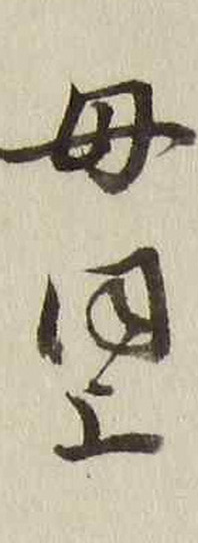母同上
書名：諸士系譜　巻之27　い之部27
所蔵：会津若松市立会津図書館
